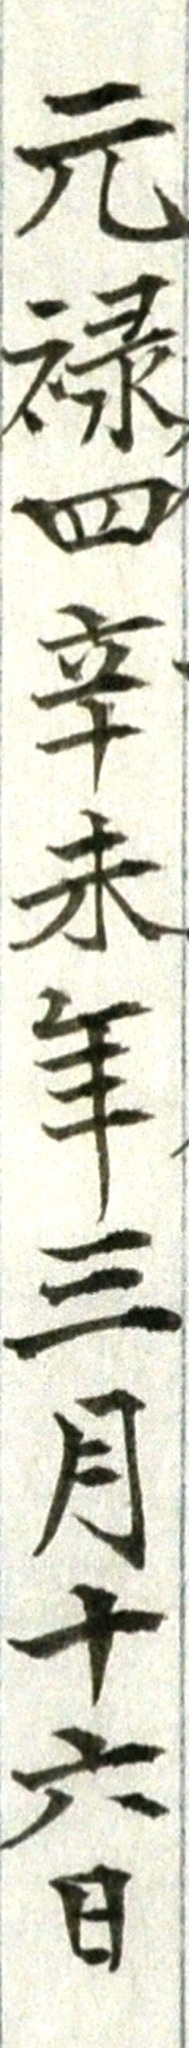元禄四辛未年三月十六日
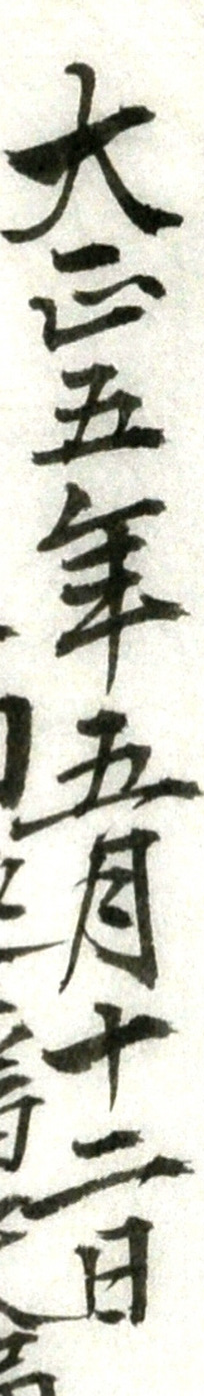大正五年五月十二日
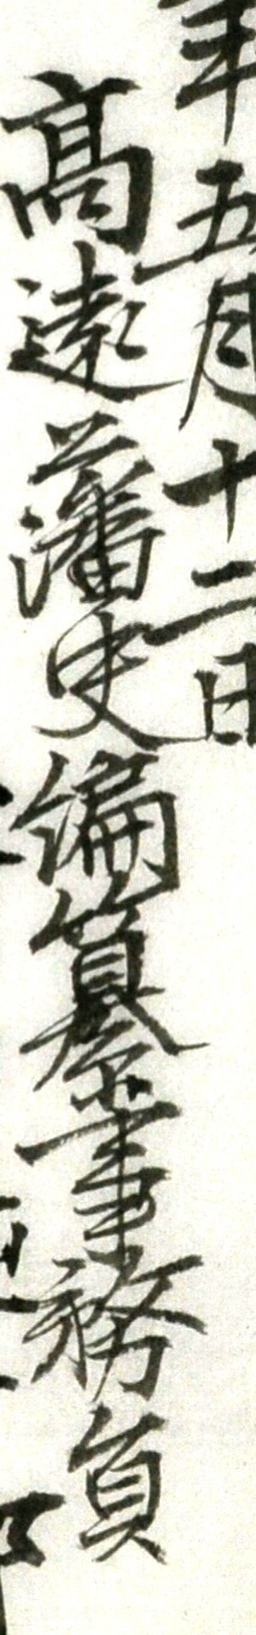高遠藩史編纂事務員
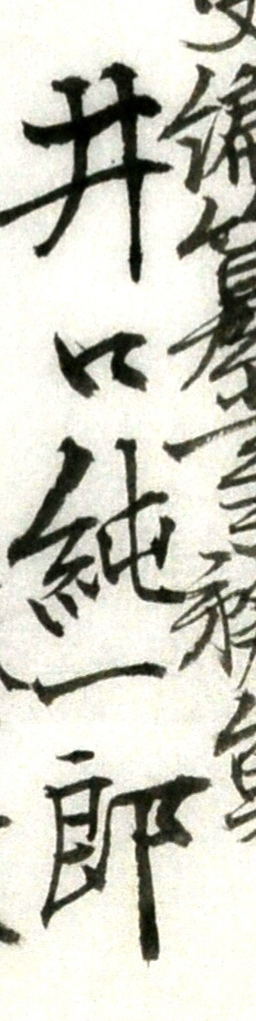井口純一郎
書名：高遠城御請取人数覚
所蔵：伊那市立高遠町図書館・合同会社AMANE
